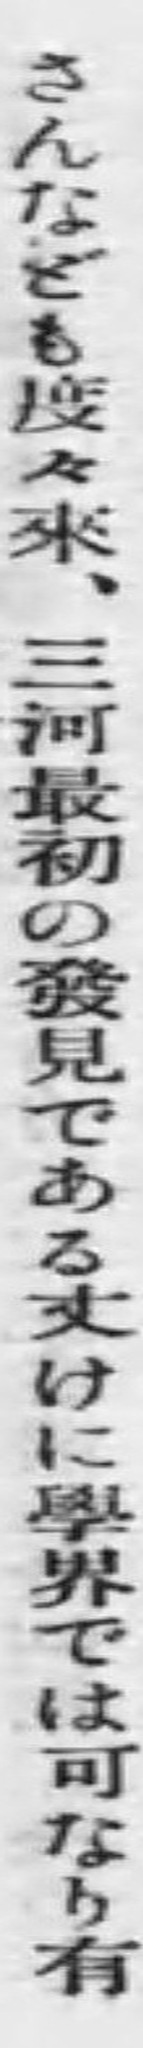さんなども度々来、三河最初の発見である丈けに学界では可なり有
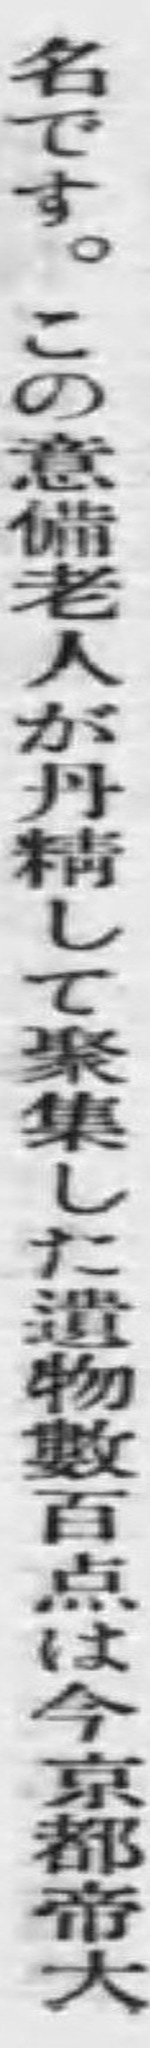名です。この意備老人が丹精して聚集した遺物数百点は今京都帝大
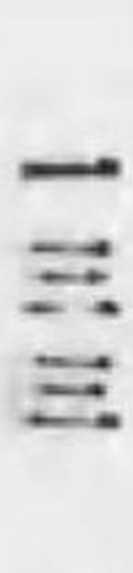一三三

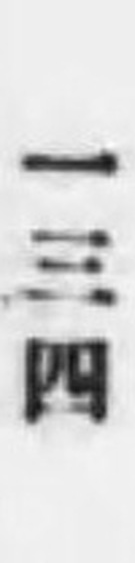一三四
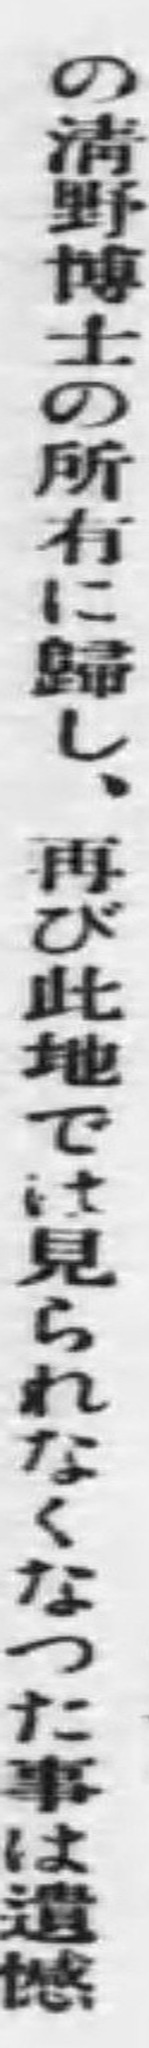の清野博士の所有に帰し、再び此地では見られなくなつた事は遺憾
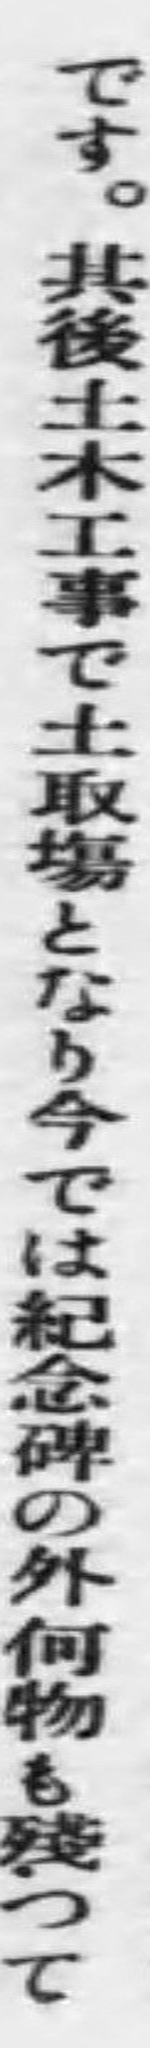です。其後土木工事で土取場となり今では紀念碑の外何物も残つて
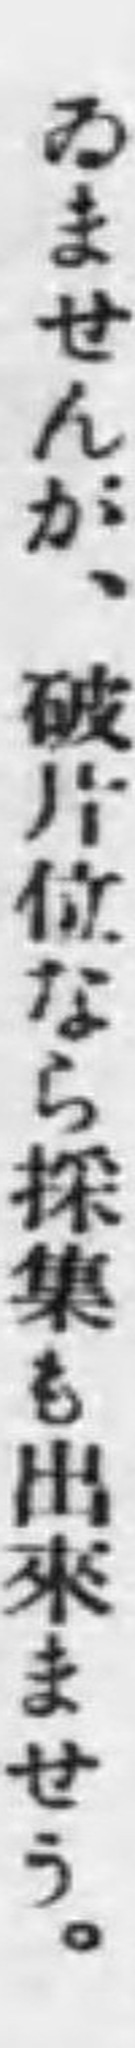ゐませんが、破片位なら採集も出来ませう。
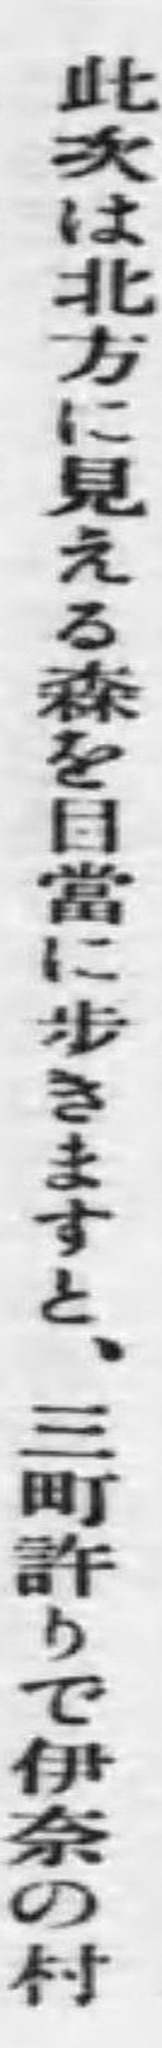此次は北方に見える森を目当に歩きますと、三町許りで伊奈の村
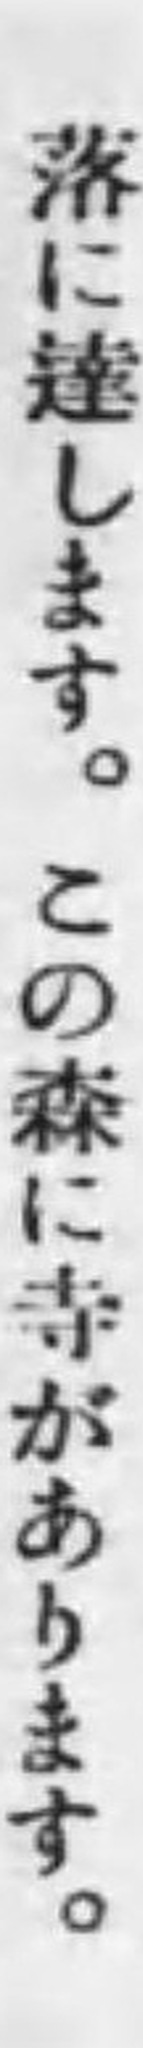落に達します。この森に寺があります。
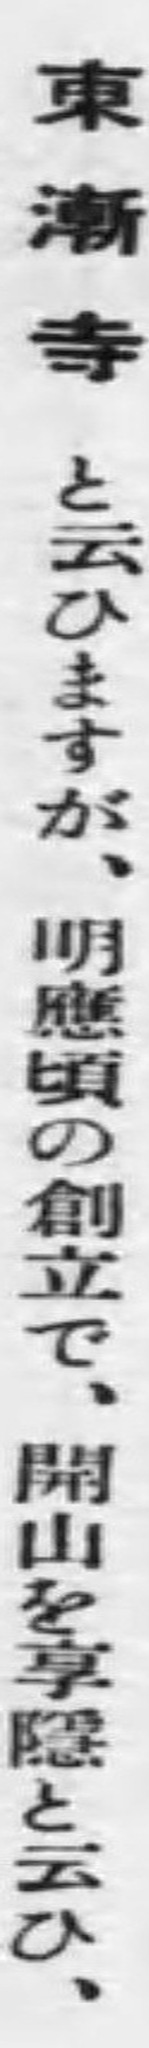東漸寺と云ひますが、明応頃の創立で、開山を享隠と云ひ、
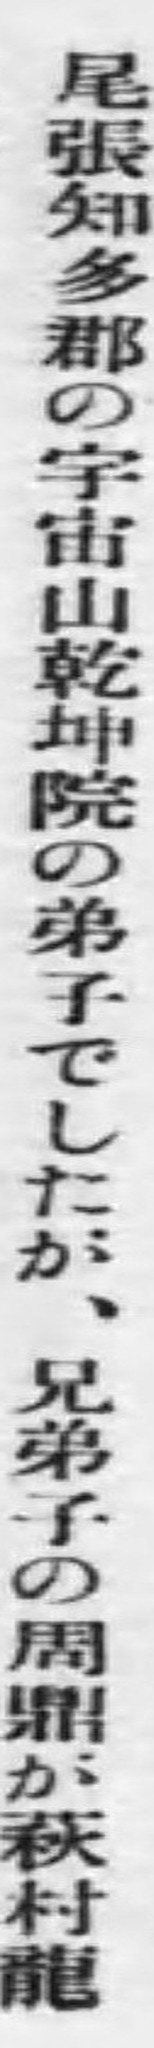尾張知多郡の宇宙山乾坤院の弟子でしたが、兄弟子の周鼎が萩村龍
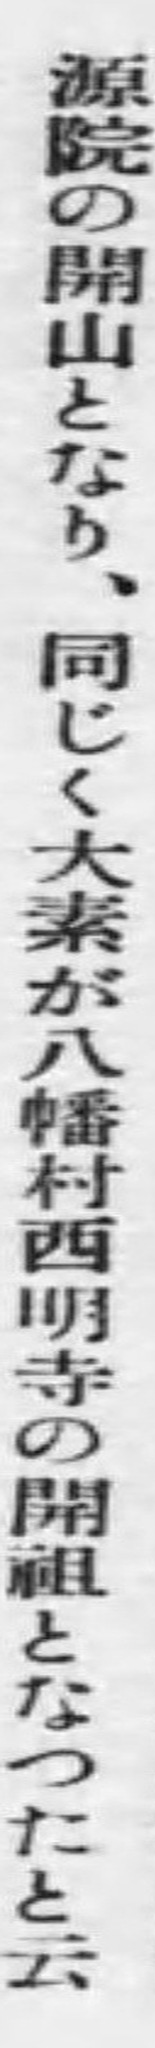源院の開山となり、同じく大素が八幡村西明寺の開祖となつたと云
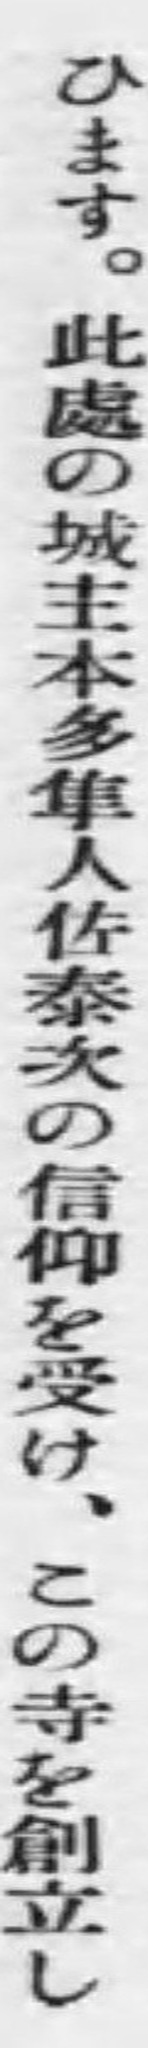ひます。此処の城主本多隼人佐泰次の信仰を受け、この寺を創立し
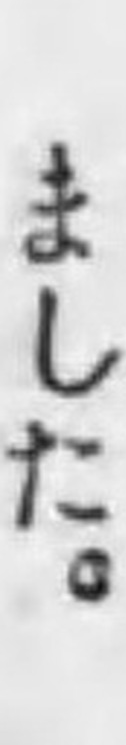ました。
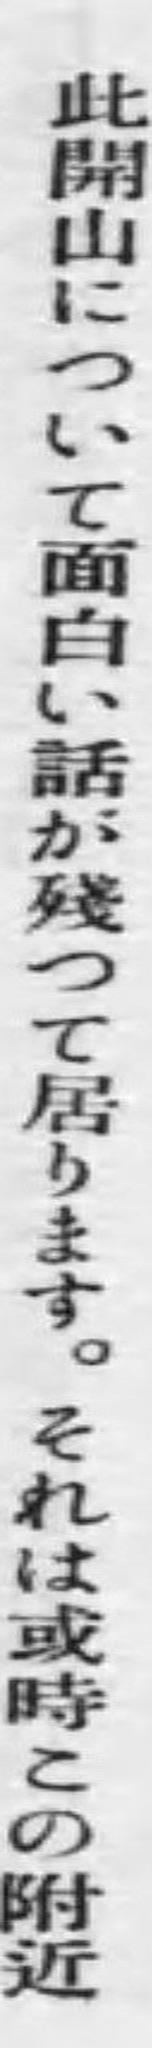此開山について面白い話が残つて居ります。それは或時この附近
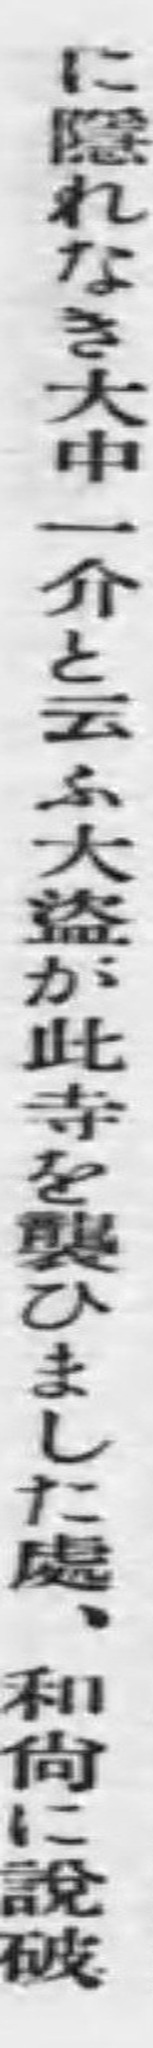に隠れなき大中一介と云ふ大盗が此寺を襲ひました処、和尚に説破
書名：東三河道中記 : 豊橋市及其附近案内
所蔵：国立国会図書館 National Diet Library, JAPAN
